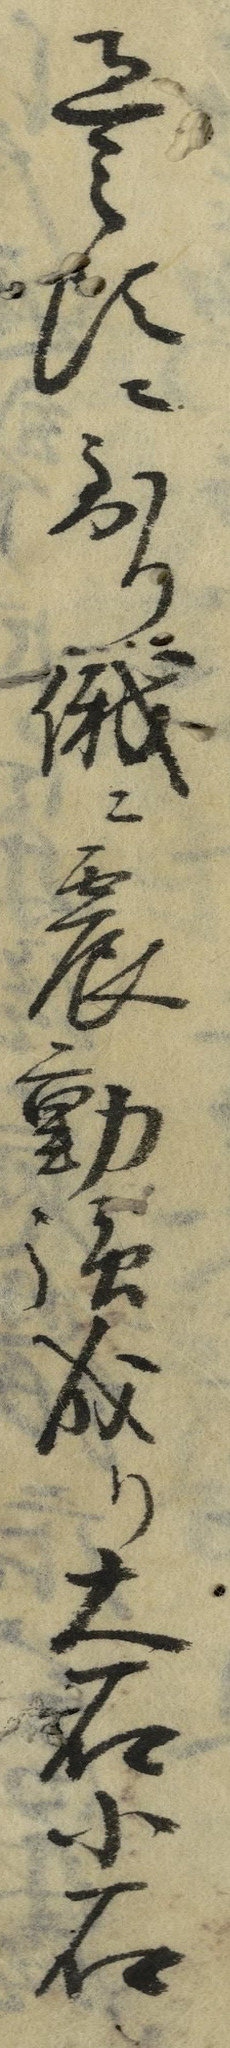過之頃に至り俄に震動強成り大石小石
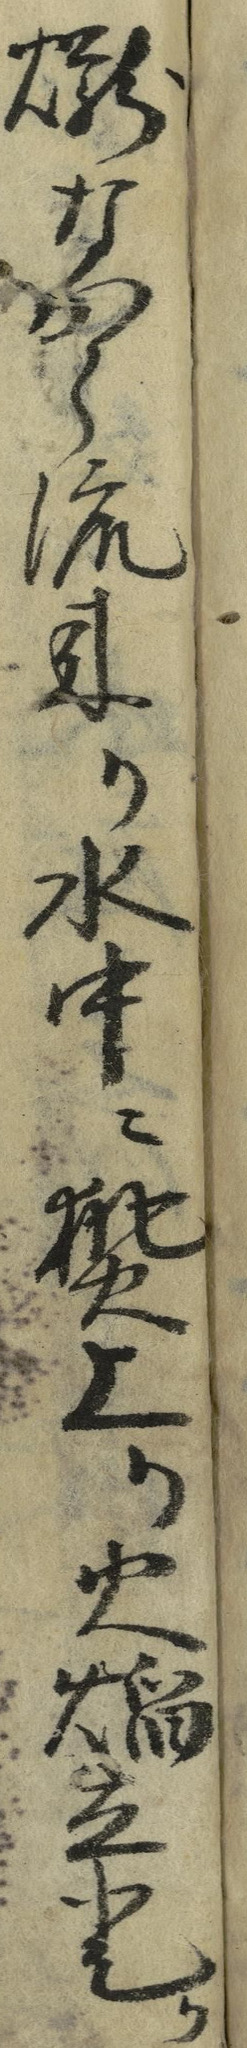燃なから流来り水中に燃上り火焔立登り
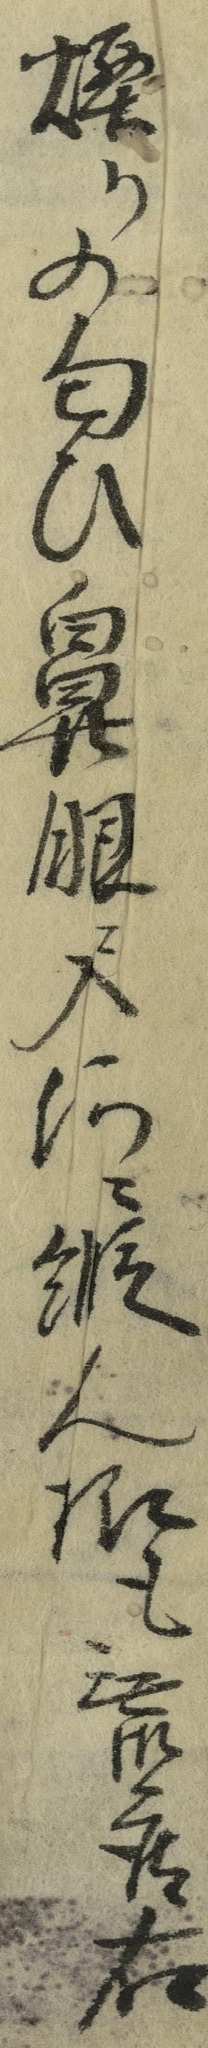煙りの匂ひ鼻眼に入何に縦ん様も無御座候右
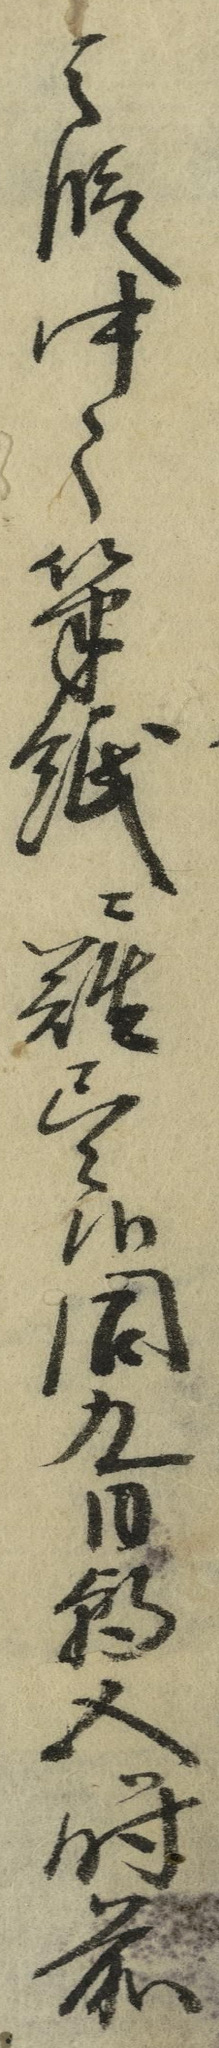之段中々筆紙に難尽候同九日朝五ツ時前
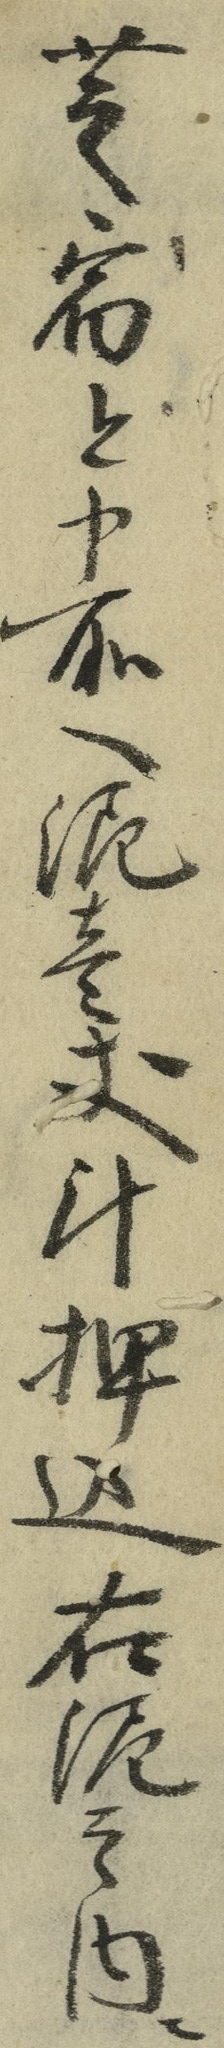芝宿と申所へ泥壱丈計押込右流之内に
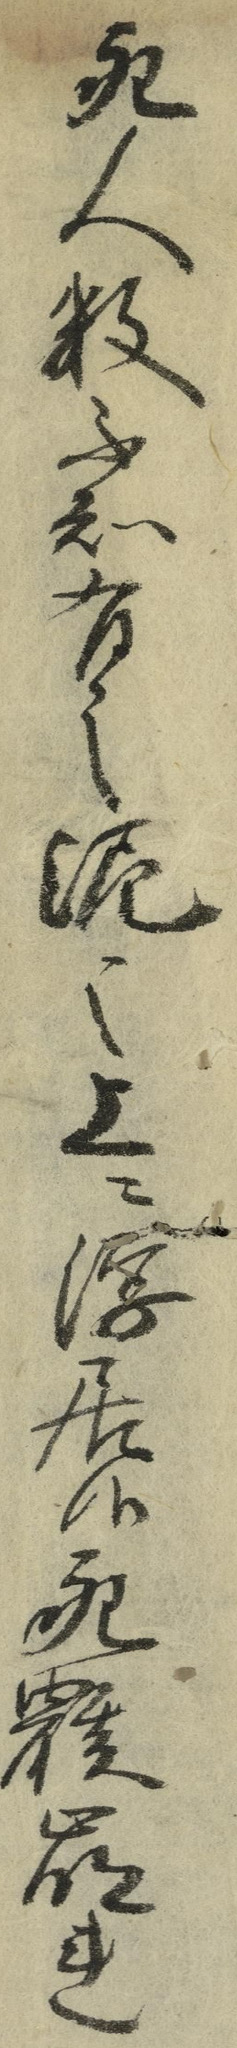死人数不知有之泥之上に浮居候死骸崩れ
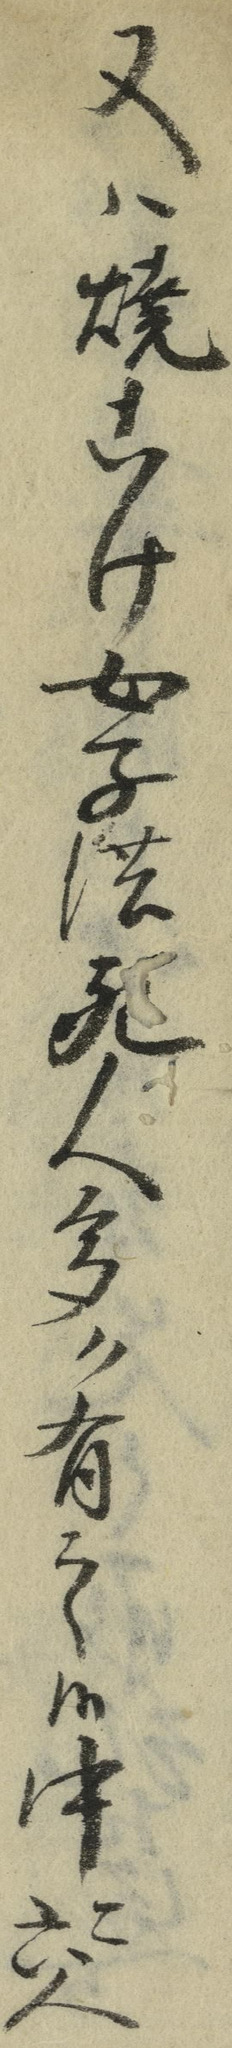又は焼こけ女子供死人多ク有之候中に六人
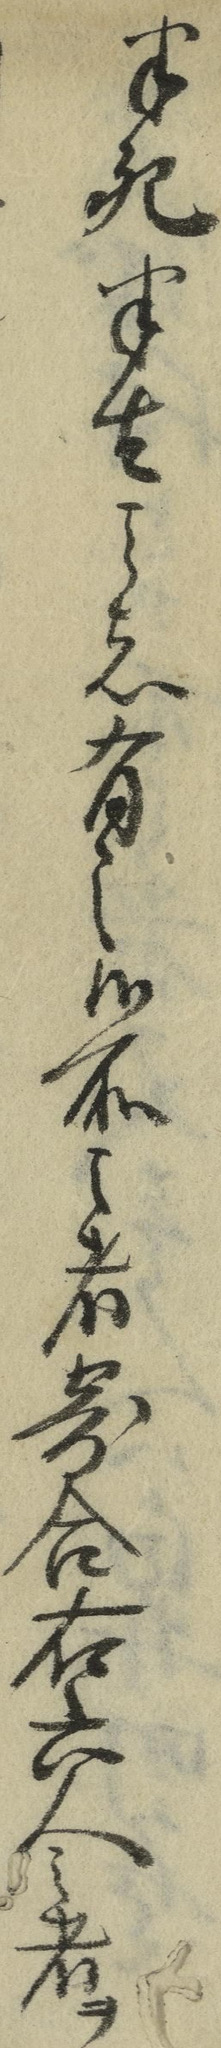半死半生之者有之候所之者寄合右六人之者ヲ
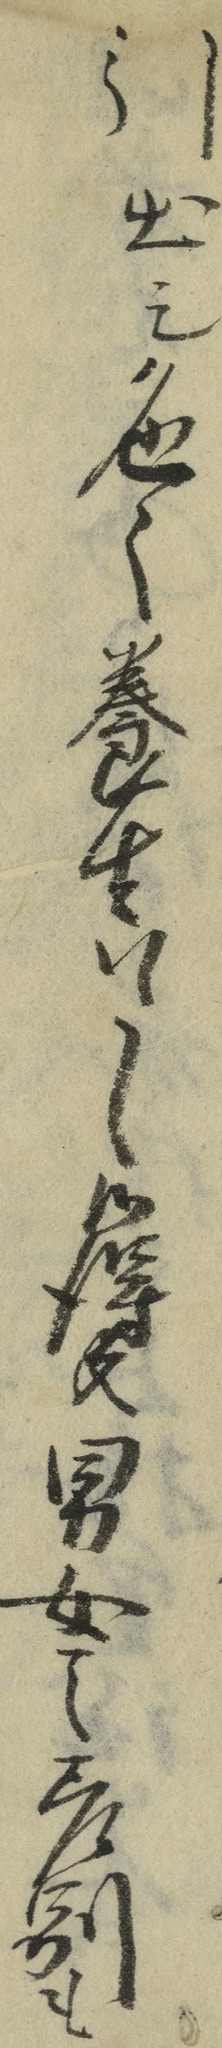引出シ色々養生いたし候得共男女之差別も
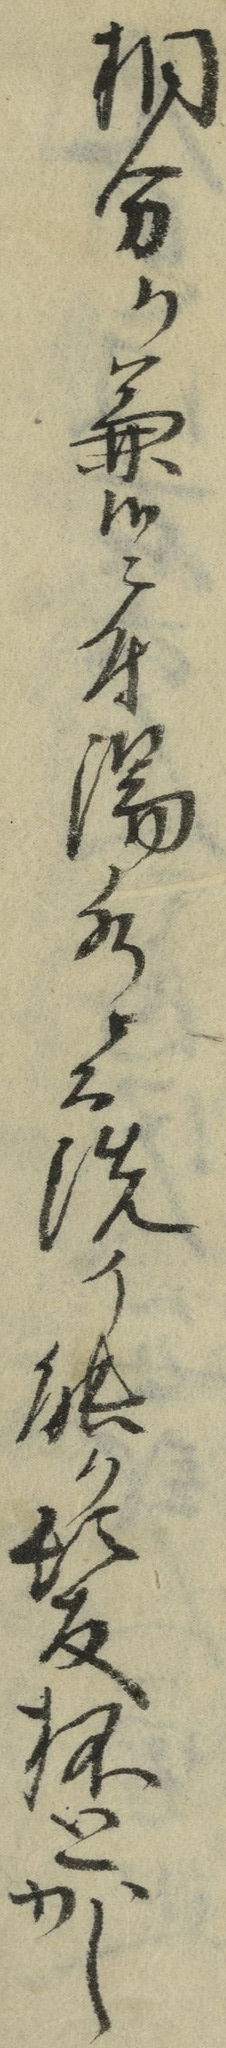相分り兼候に付湯水に而洗イ能ク髪杯とかし

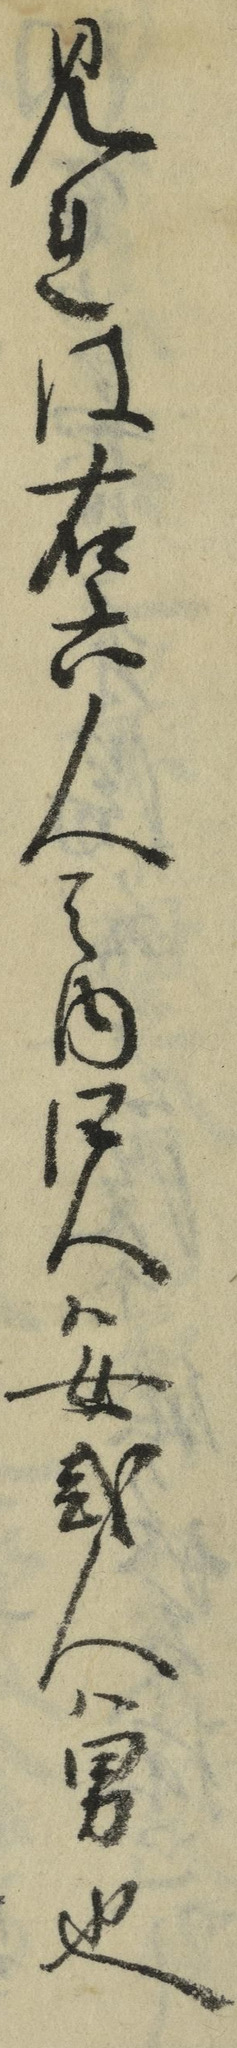見れは右六人之内四人は女弐人は男也
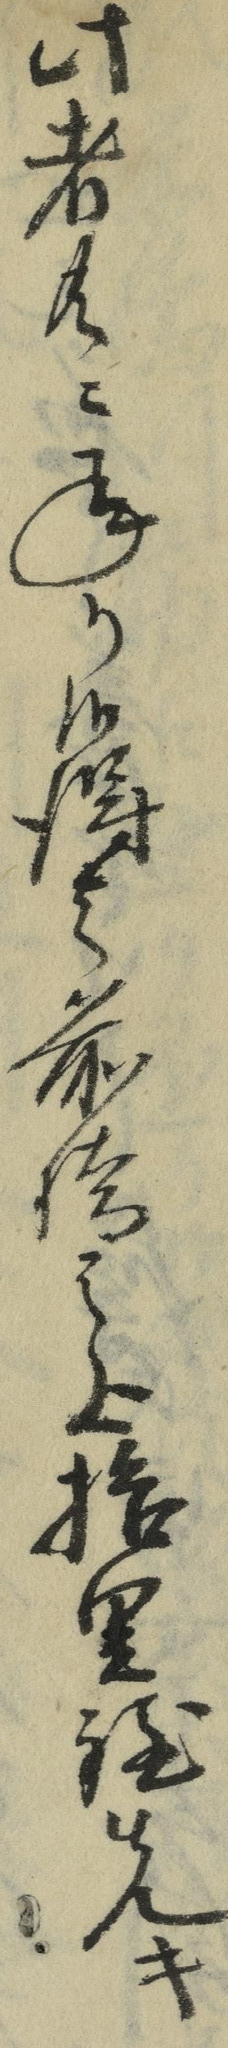此者共に承り候得者前橋之上拾里程先キ
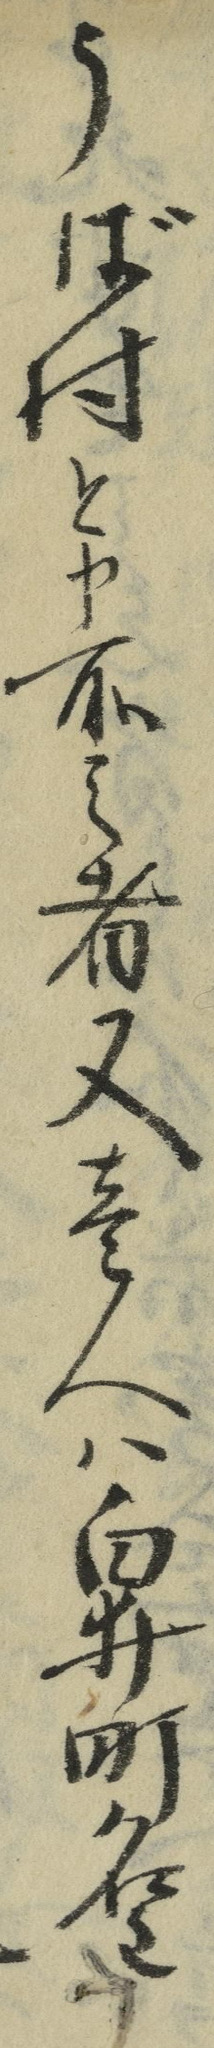うば村と申所之者又壱人は白井町名主
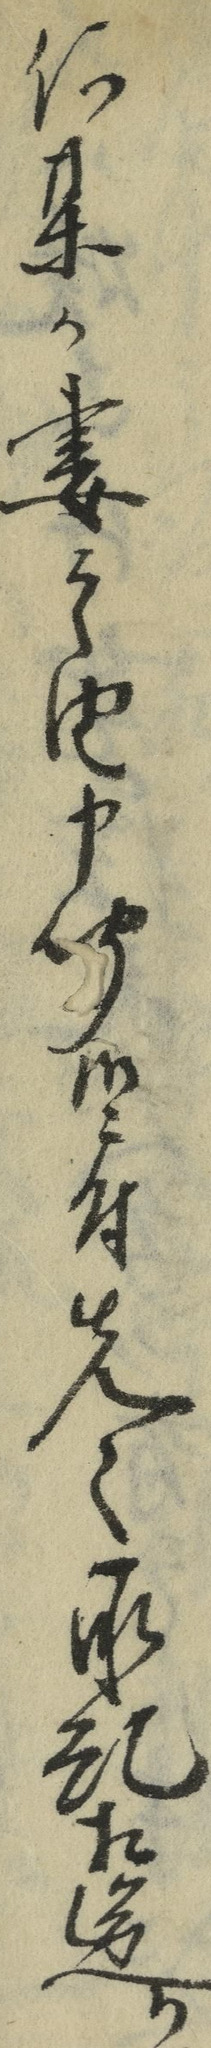何某か妻之由申聞候に付先々承記相送り
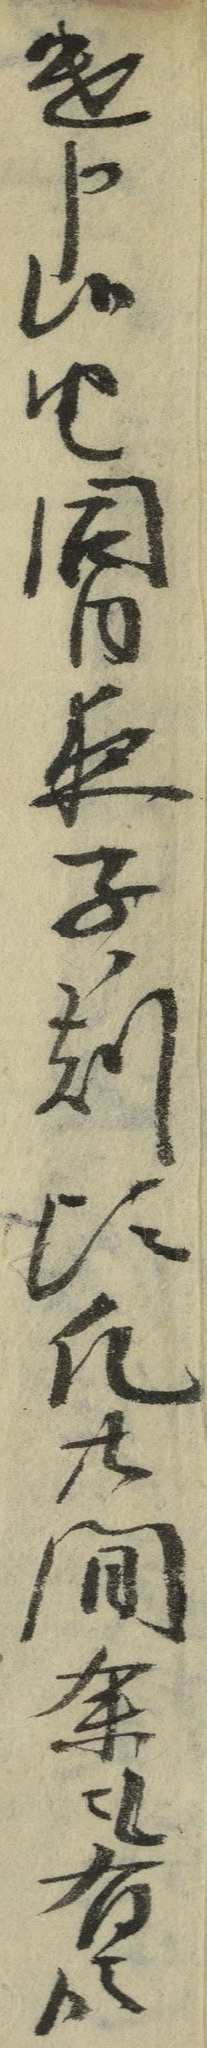遣申候由同日夜子ノ刻頃凡廿間余も有哉
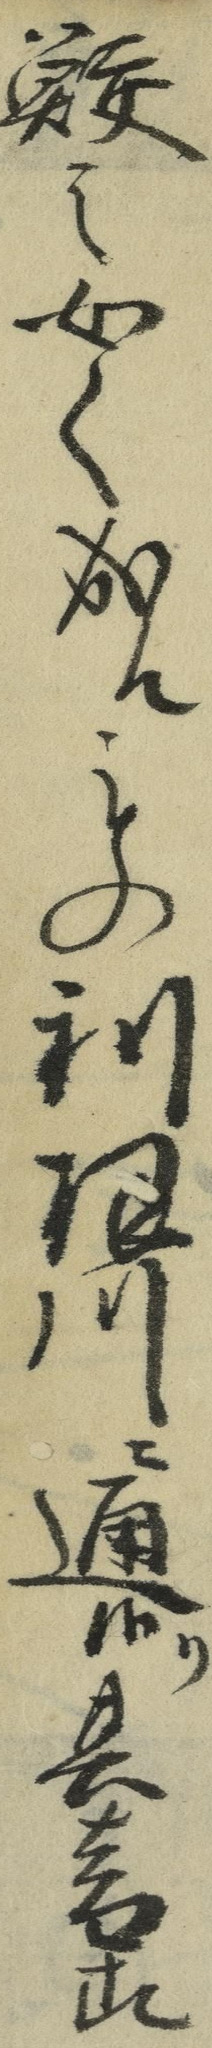鮫之如く成ルもの利根川に通り候其音す
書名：天明三卯年七月　浅間山焼注進写
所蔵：東京大学地震研究所図書室 Earthquake Research Institute Library, The University of Tokyo, JAPAN
